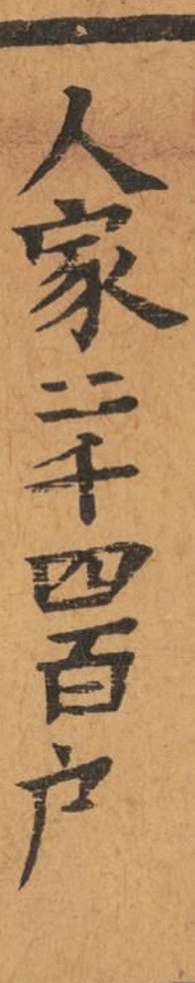人家二千四百戸
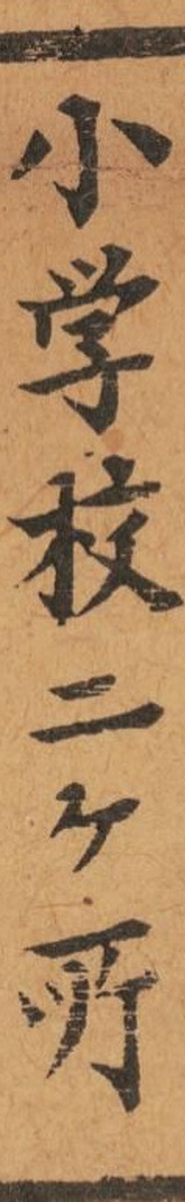小学校ニケ所
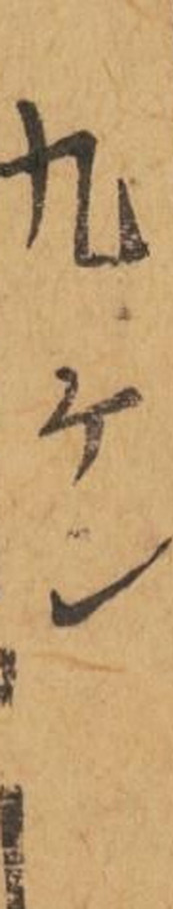九ケン
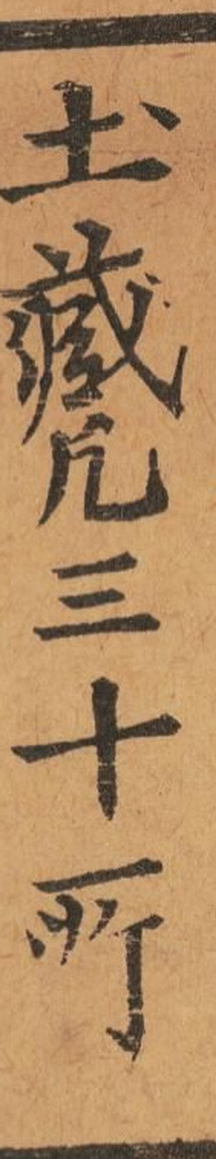土蔵凡三十所
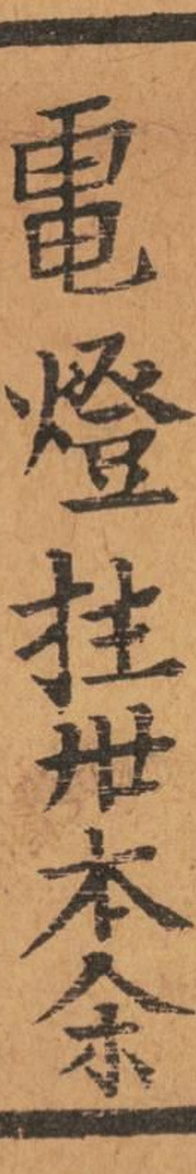電燈柱卅本余
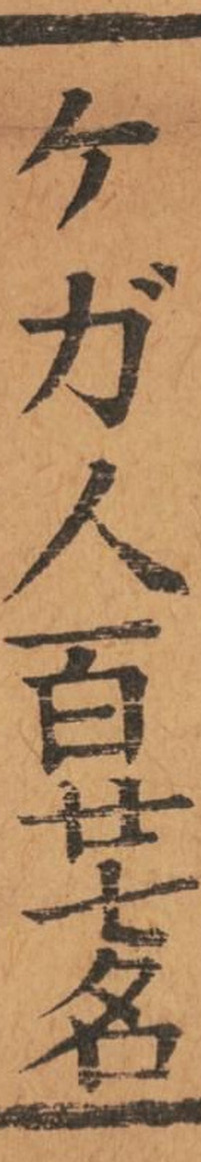ケガ人百廿七名
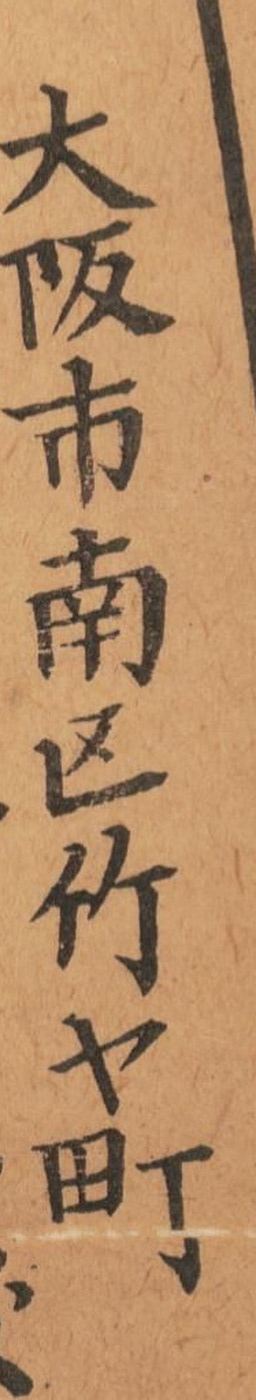大阪市南区竹ヤ町
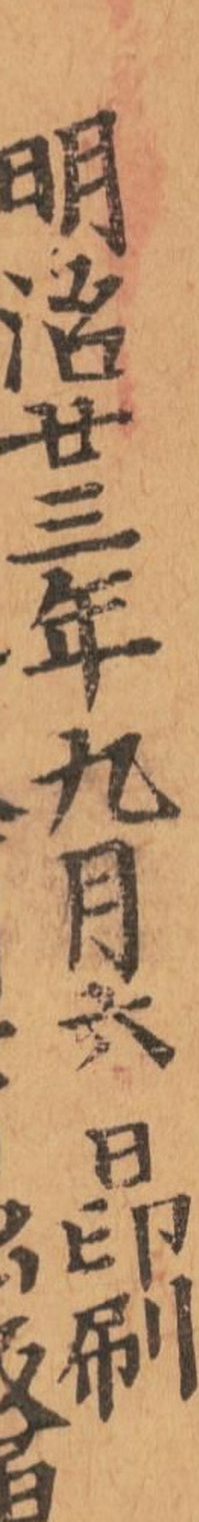明治廿三年九月六日印刷
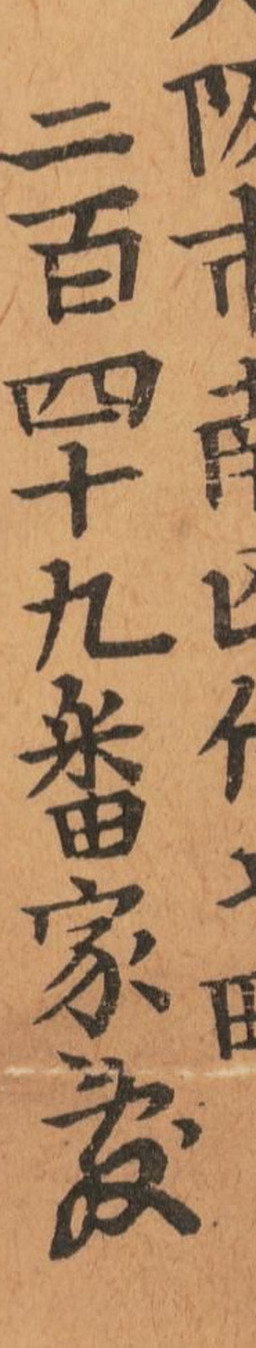二百四十九番家敷
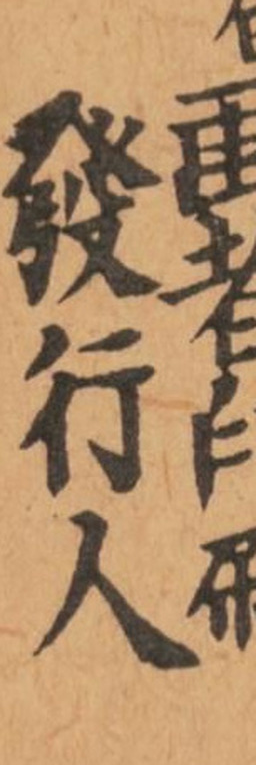発行人
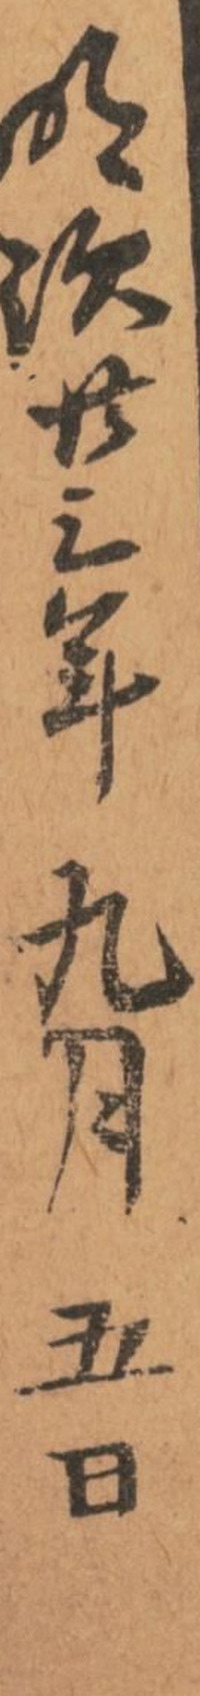明治廿三年九月五日
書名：大阪新町大火詳圖
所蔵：東京大学地震研究所図書室 Earthquake Research Institute Library, The University of Tokyo, JAPAN
